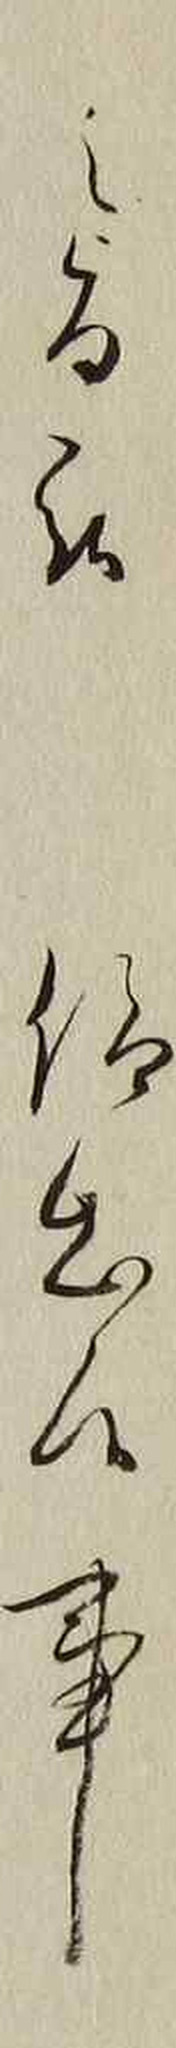之旨被仰出候事
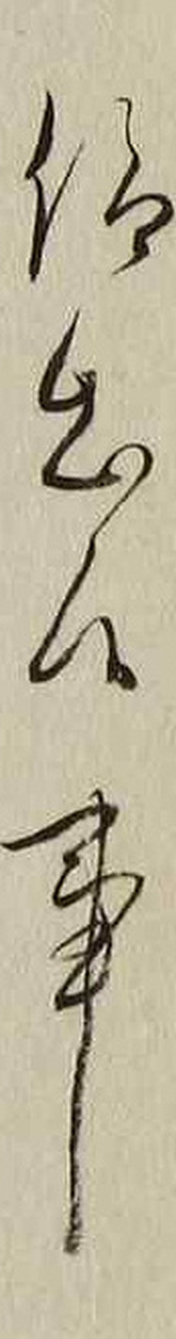仰出候事
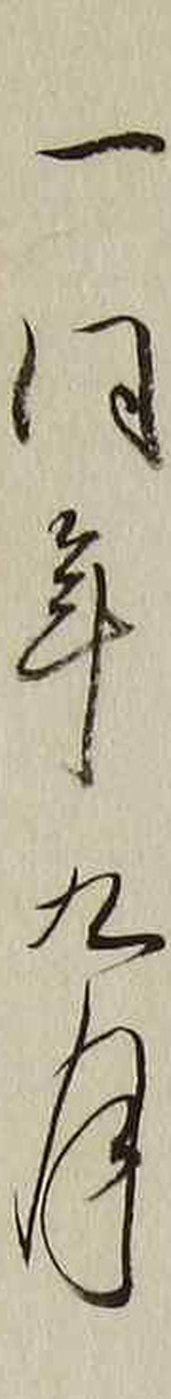一同年九月
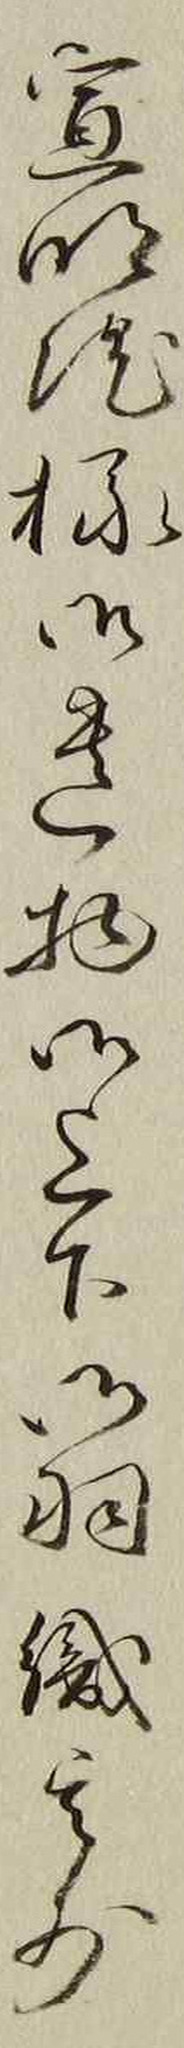宣明院様御遺物御上下御羽織其外
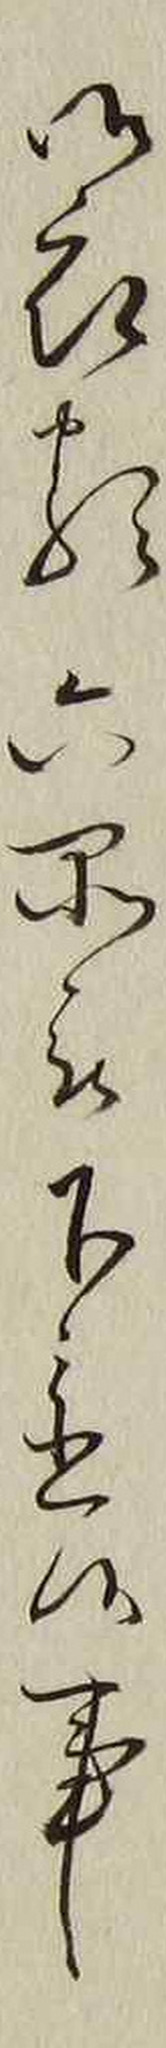御衣類六品被下置候事
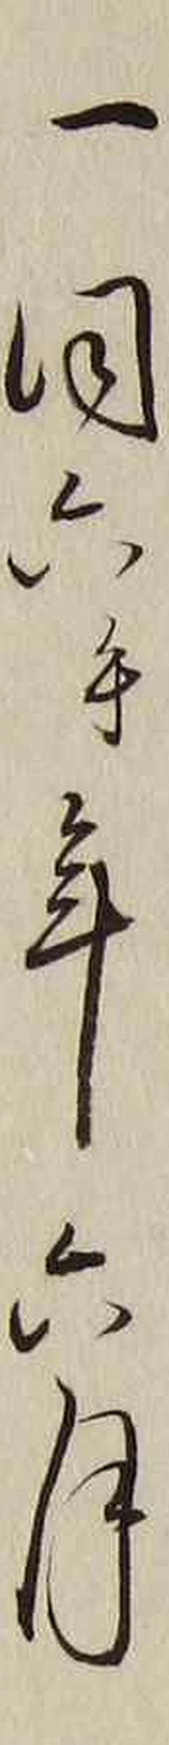一同六午年六月
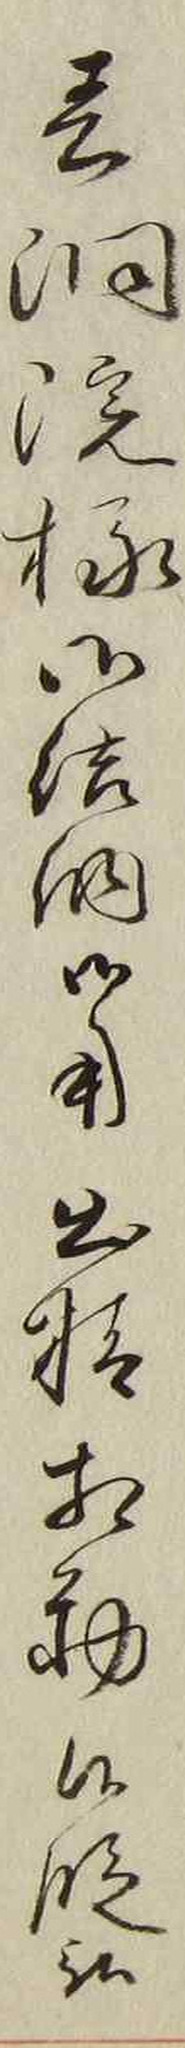春洞院様御結納御用出精相勤候段被

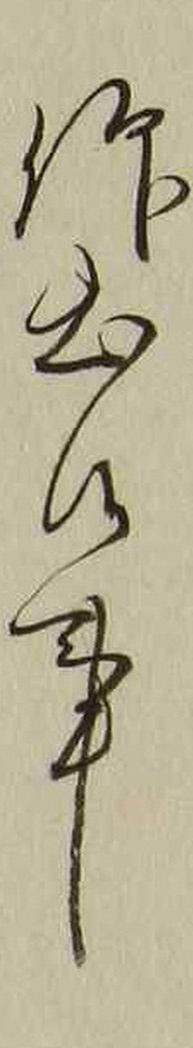仰出候事
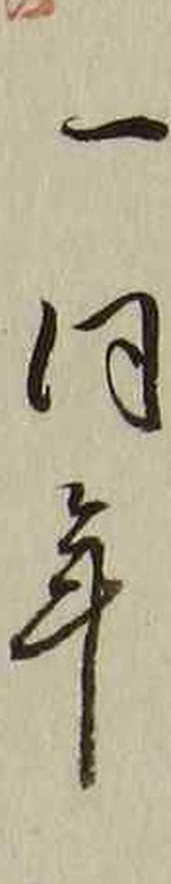一同年
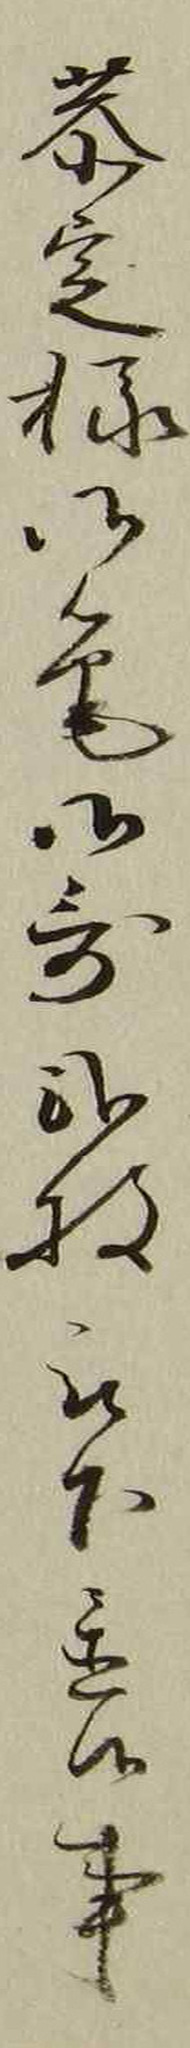恭定様御筆御歌弐枚被下置候事
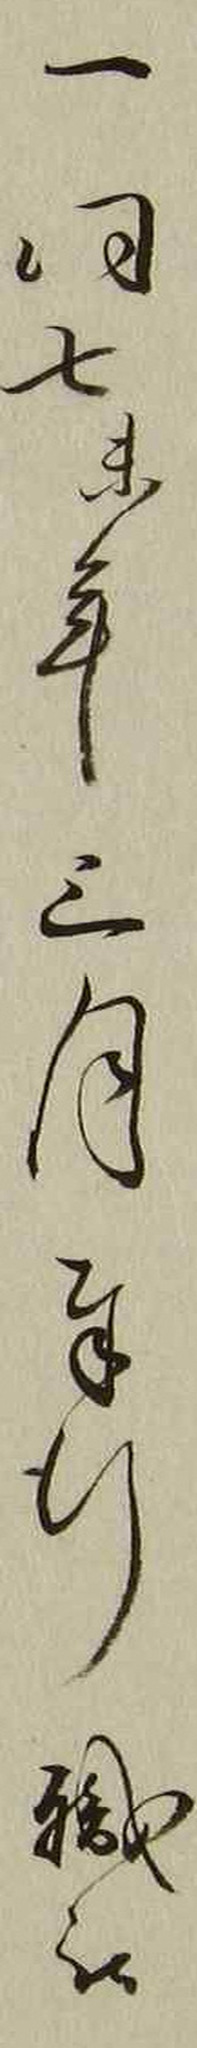一同七未年三月奉行職被
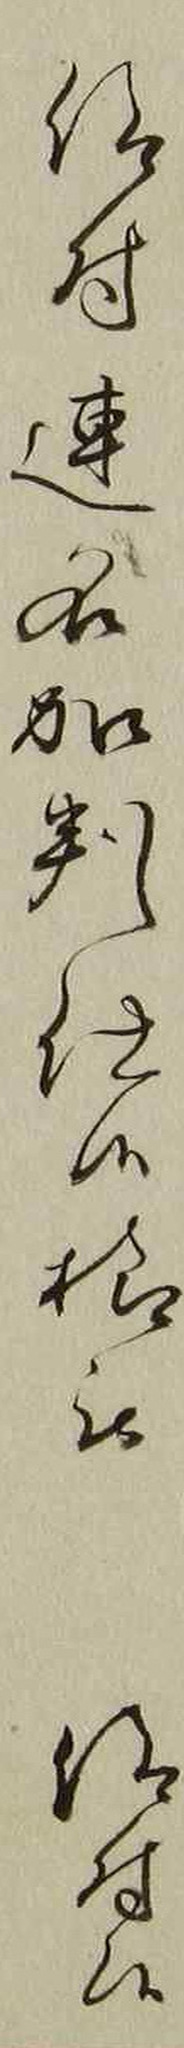仰付連名加判仕候様被仰付候
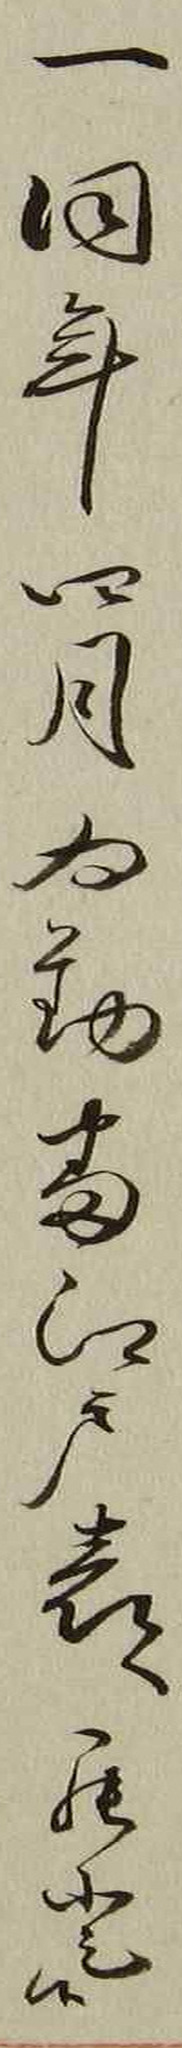一同年四月為勤番江戸表へ罷登候
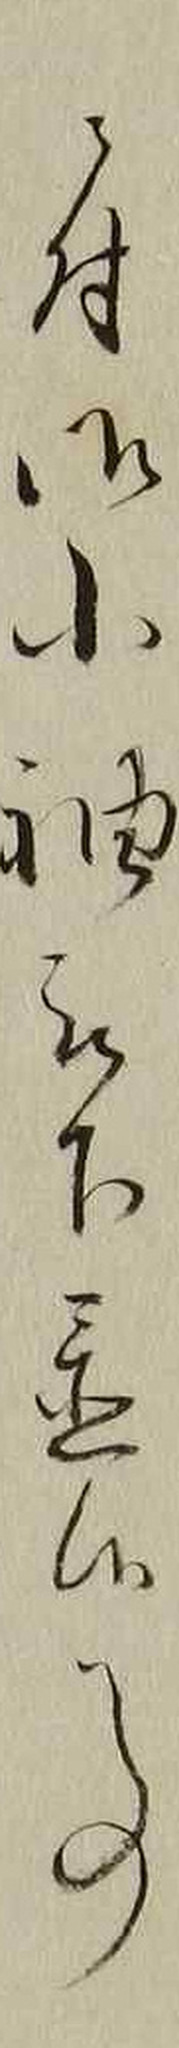ニ付御小袖被下置候事
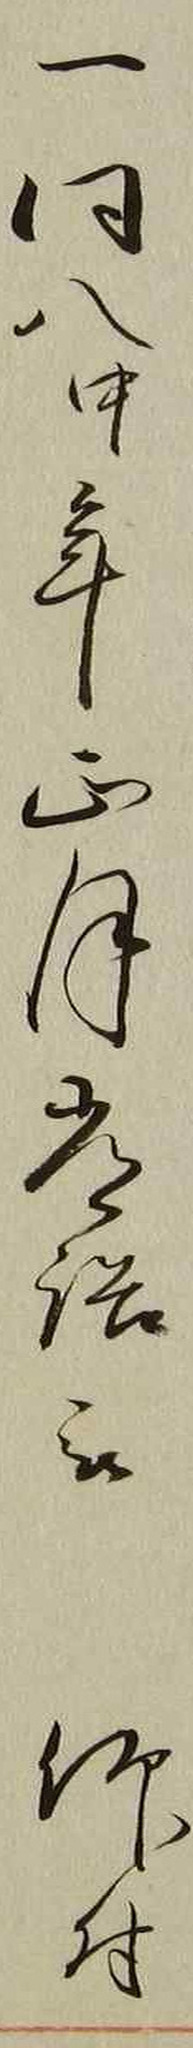一同八申年正月常詰被仰付
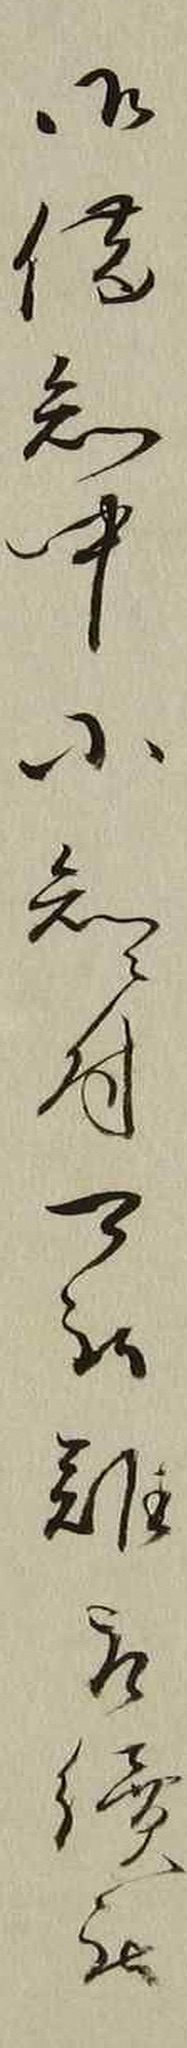御借知中小知ニ付可被難取続被
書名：諸士系譜　巻之2　い之部2
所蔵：会津若松市立会津図書館
